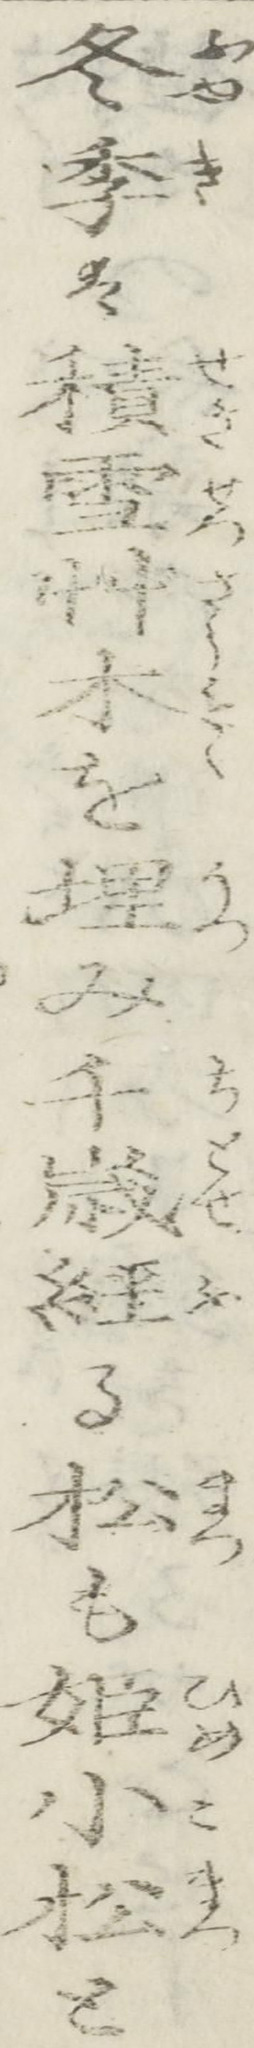冬季は積雪艸木を埋み千歳経る松も姫小松と
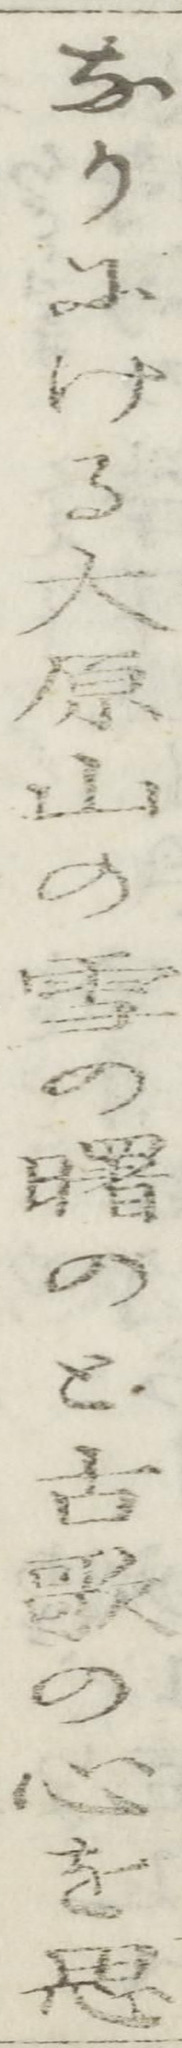なりにける大原山の雪の曙のと古歌の心を思
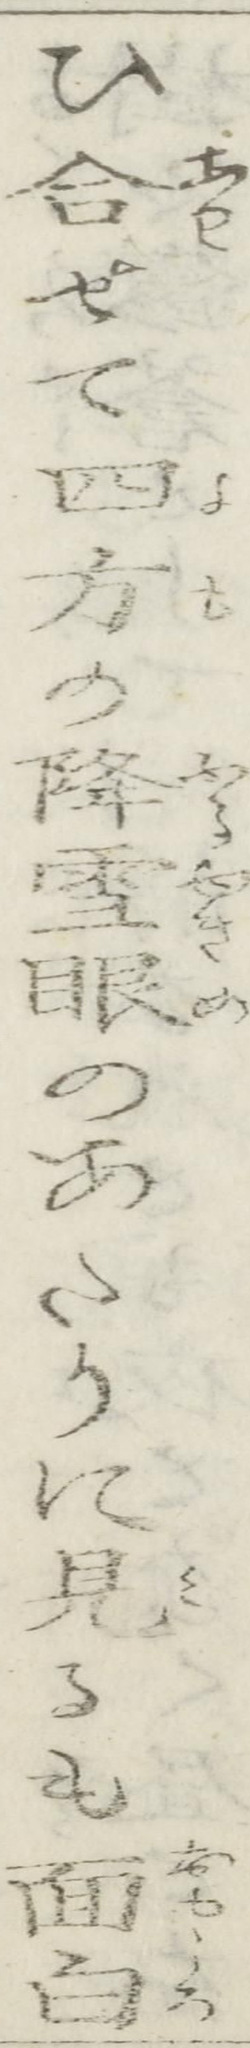ひ合せて四方の降雪眼のあたりに見るも面白
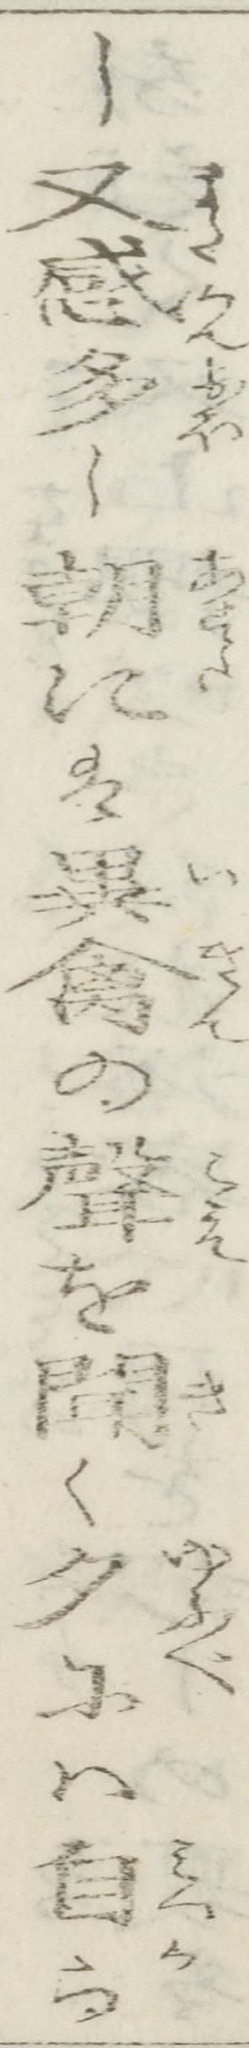し又感多し朝には異禽の声を聞く夕には自ら
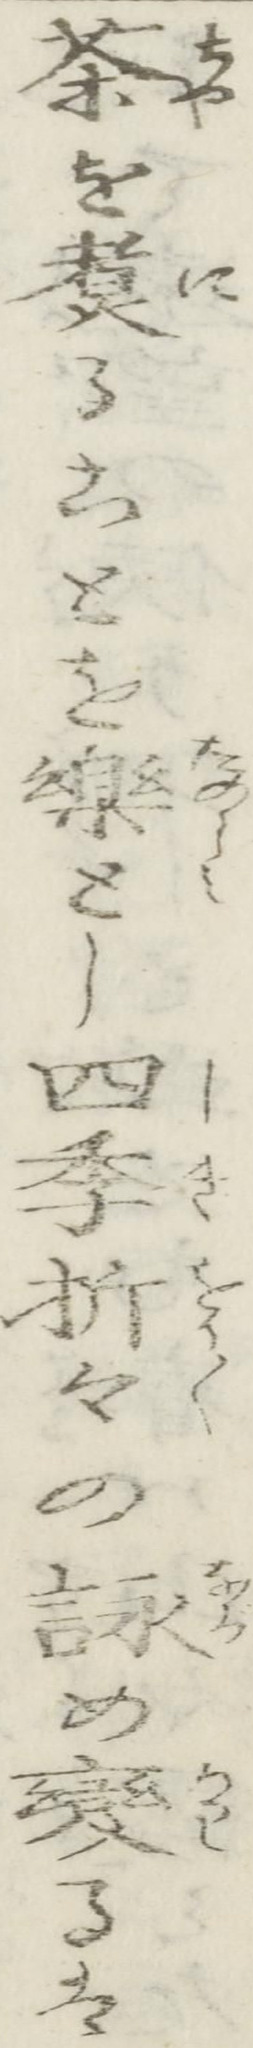茶を煮ることを楽とし四季折々の詠め変るを
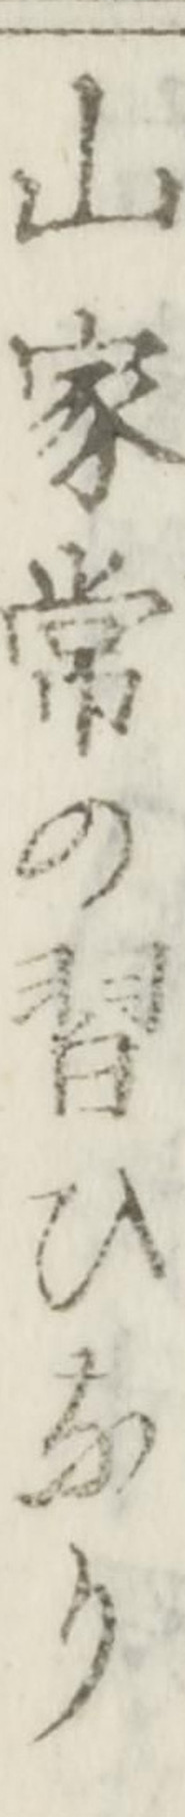山家常の習ひなり
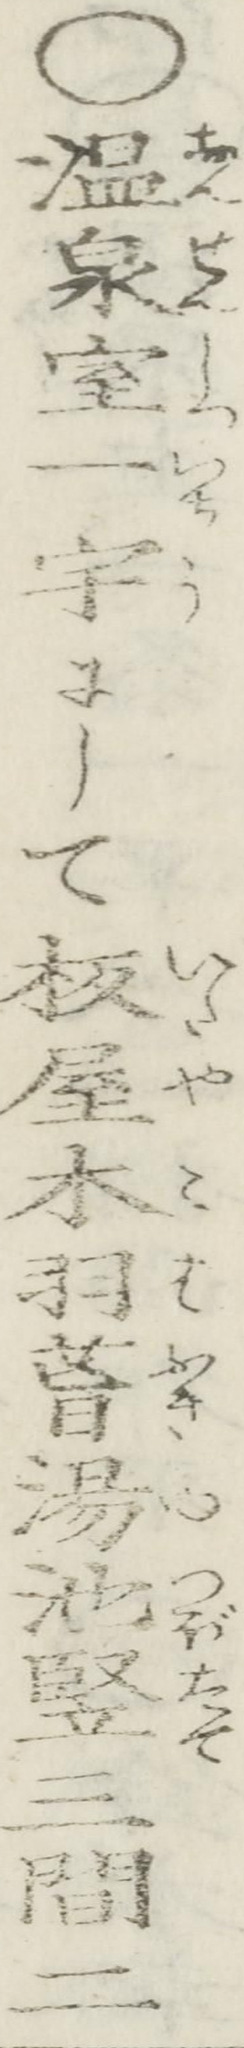〇温泉室一宇にして板屋木羽葺湯油竪三間二
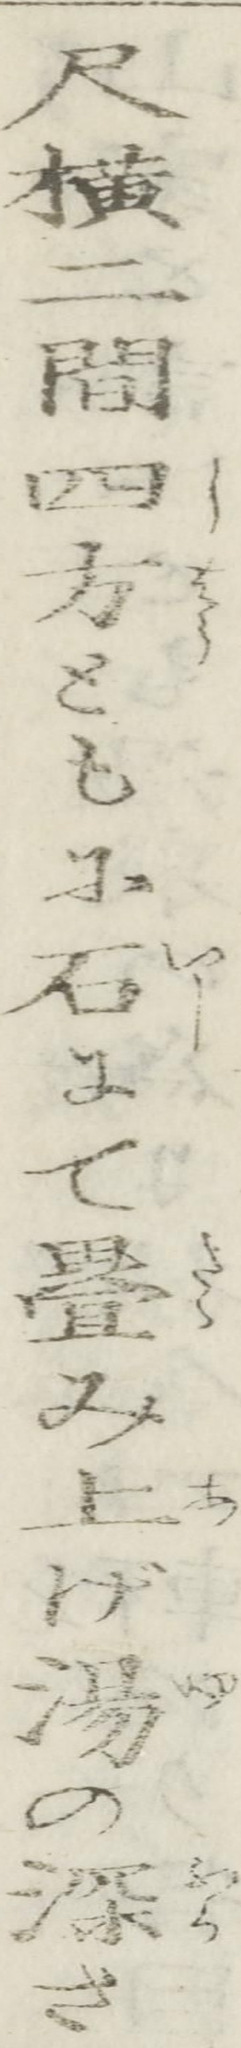尺横二間四方ともに石にて畳み上げ湯の深さ
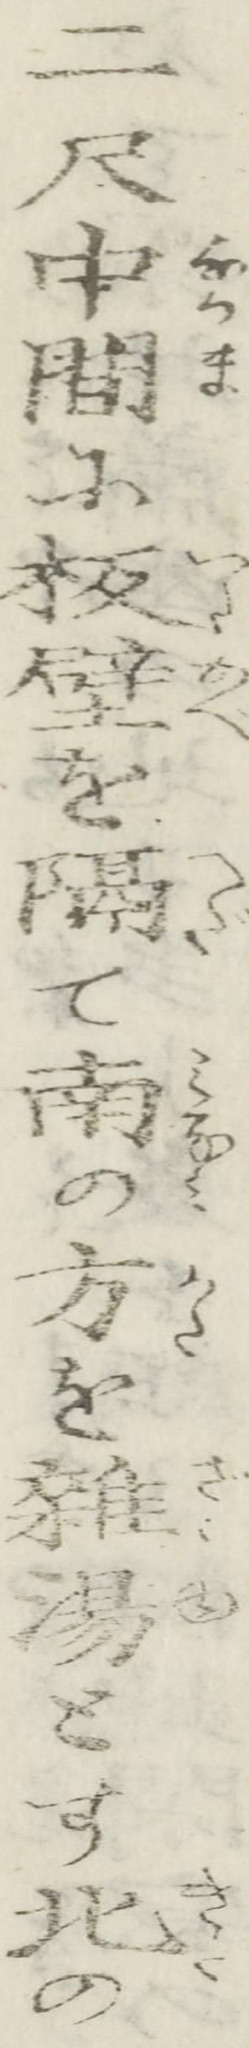二尺中間に板壁を隔て南の方を雑湯とす北の
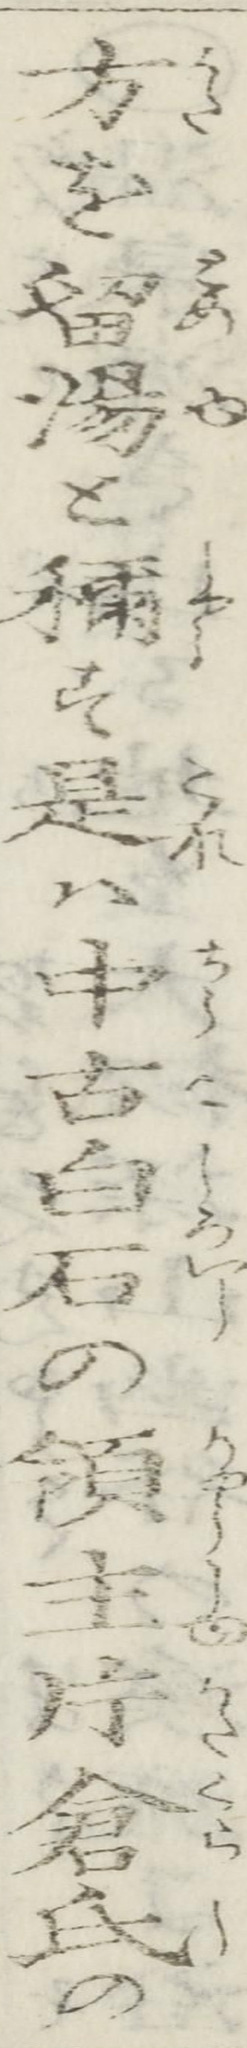方を留湯と称す是は中古白石の領主片倉氏の
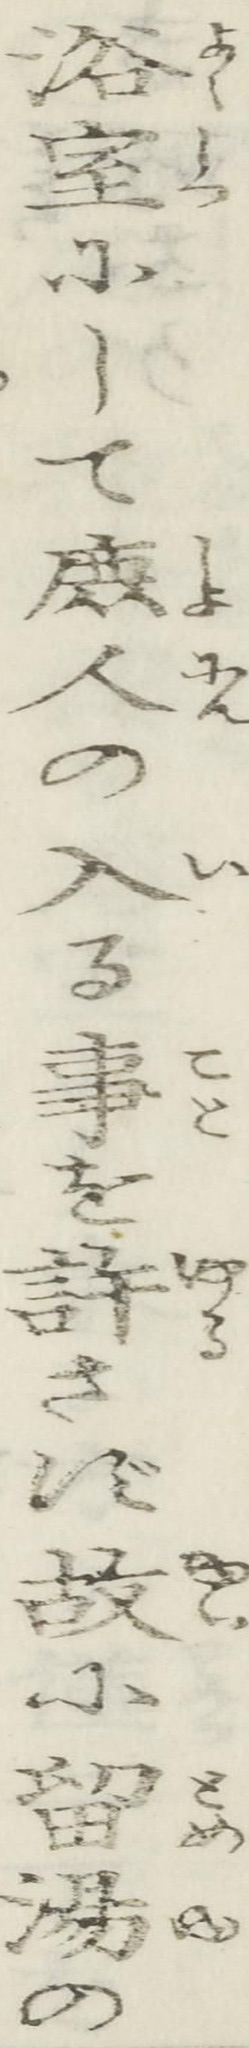浴室にして庶人の入る事を許さず故に留湯の
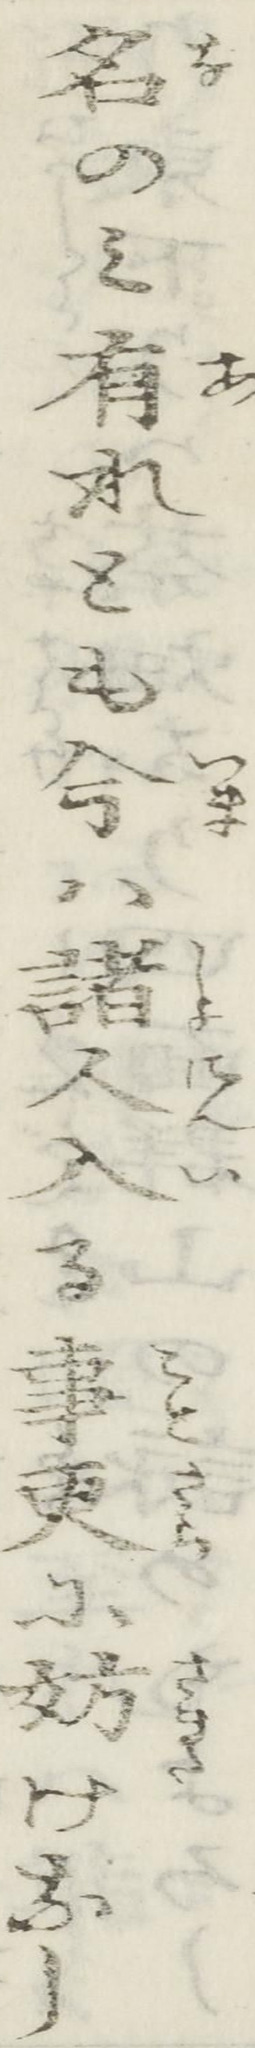名のみ有れとも今は諸人入る事更に妨けなし
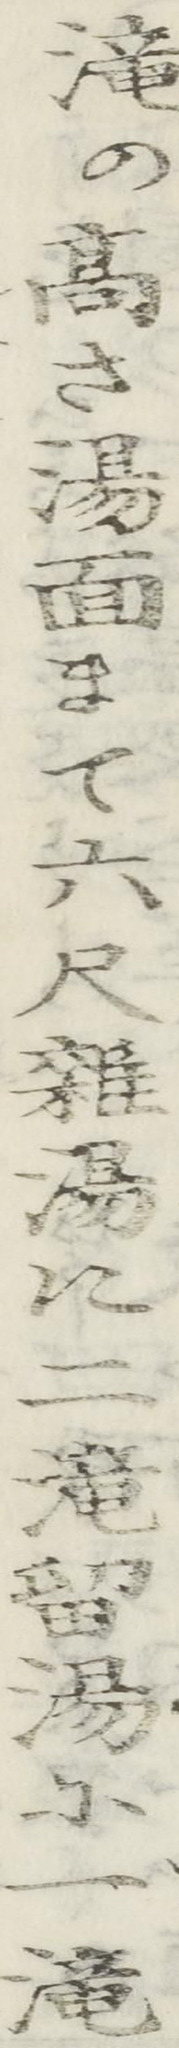滝の高さ湯面まて六尺雑湯に二滝留湯に一滝
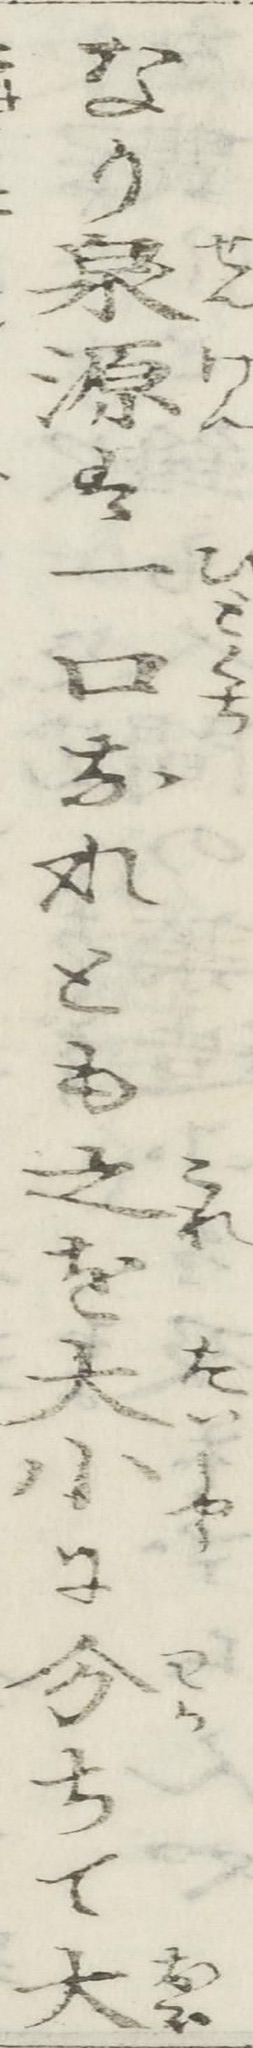なり泉源を一口なれとも之を大小に分ちて大
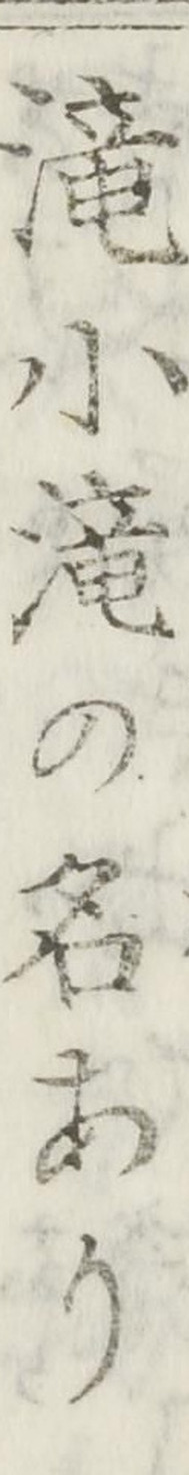滝小滝の名あり
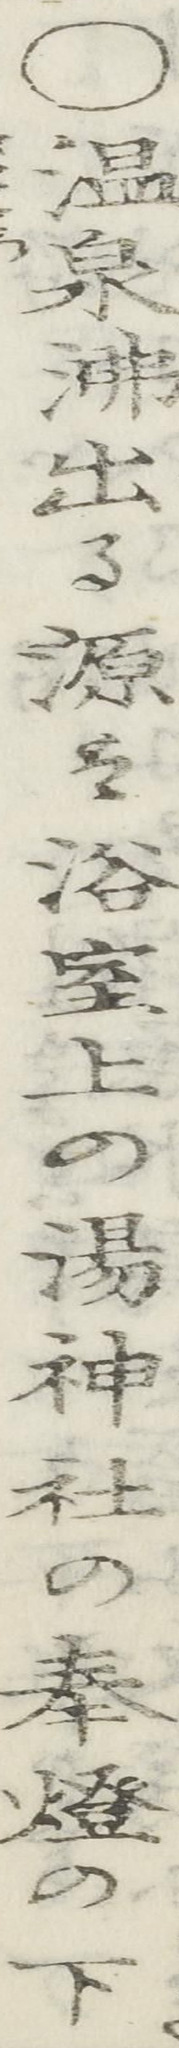〇温泉沸出る源は浴室上の湯神社の奉灯の下
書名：鎌先温泉由來記
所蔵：東京大学地震研究所図書室 Earthquake Research Institute Library, The University of Tokyo, JAPAN
